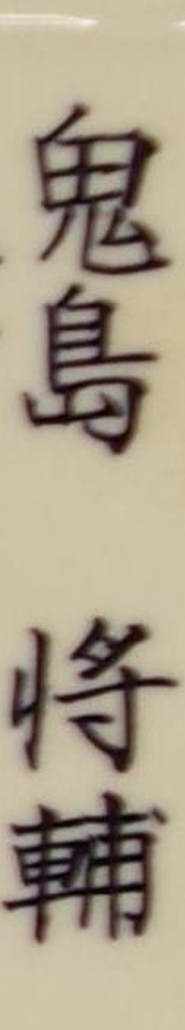鬼島将輔
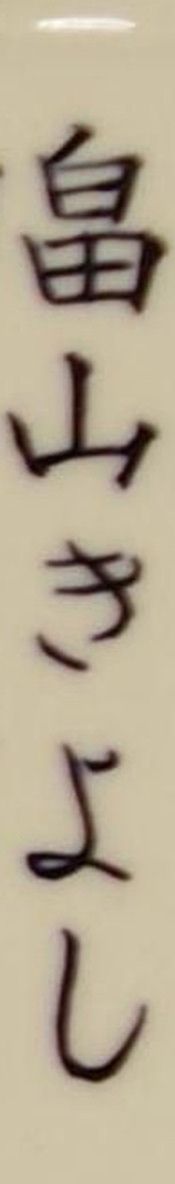畠山きよし
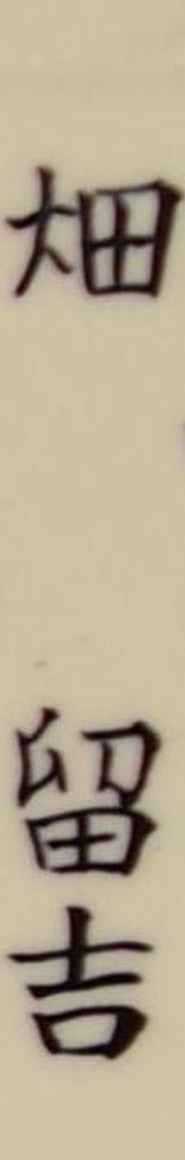畑留吉
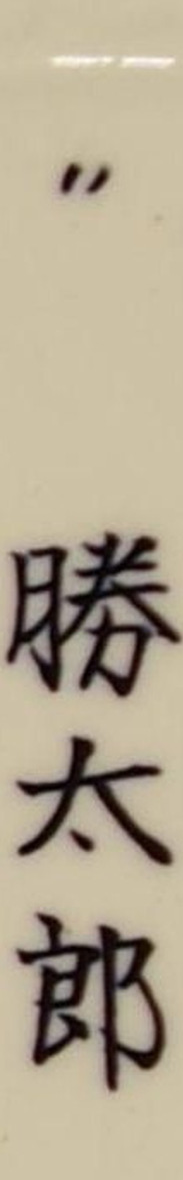勝太郎
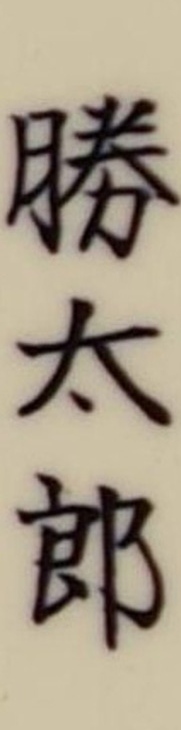勝太郎
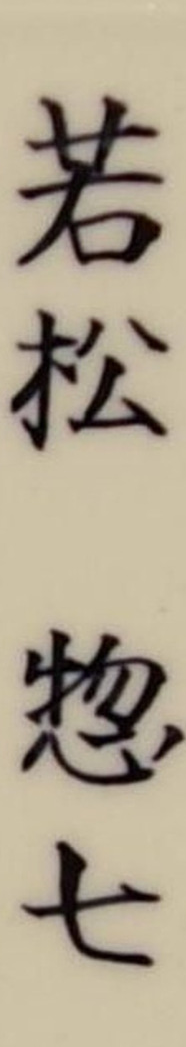若松惣七
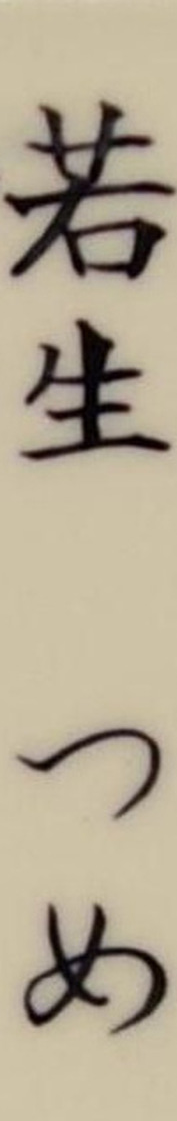若生つめ
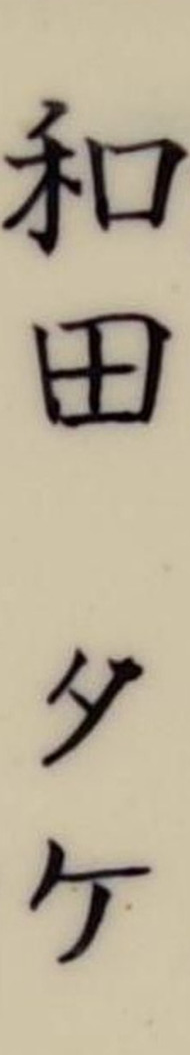和田夕ケ
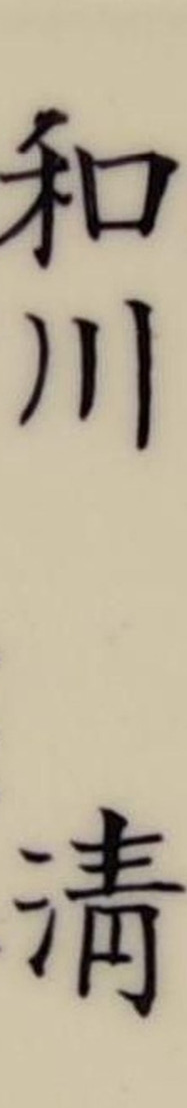和川清
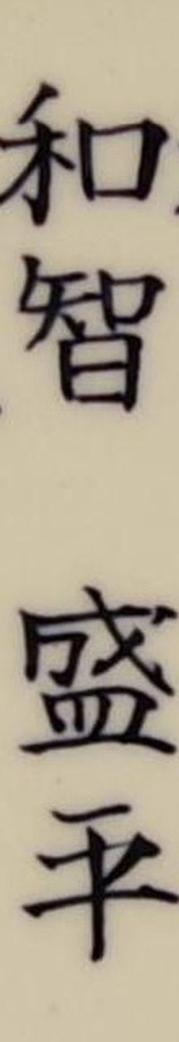和智盛平
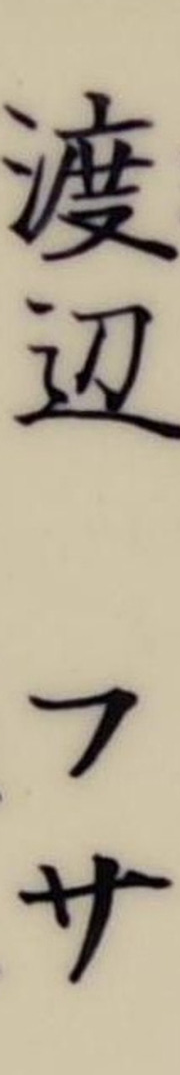渡辺フサ
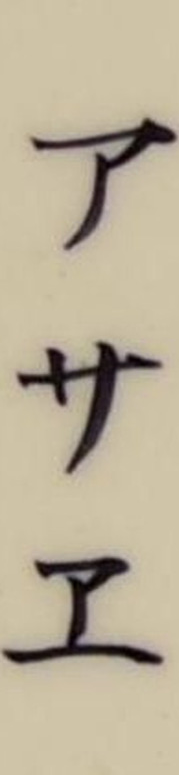アサエ
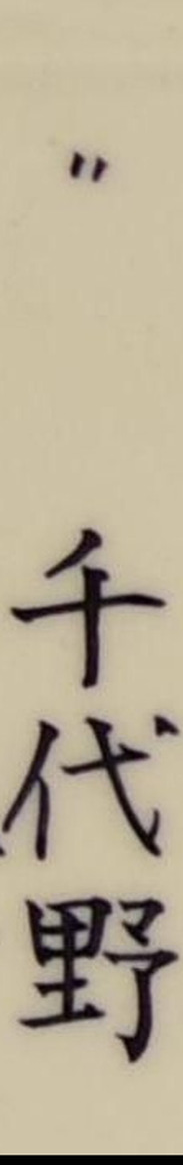千代野
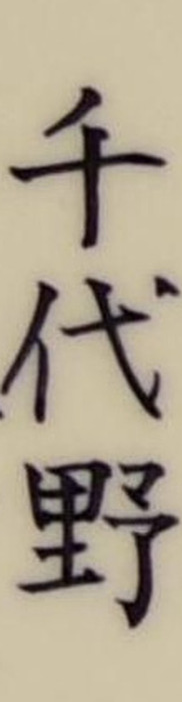千代野
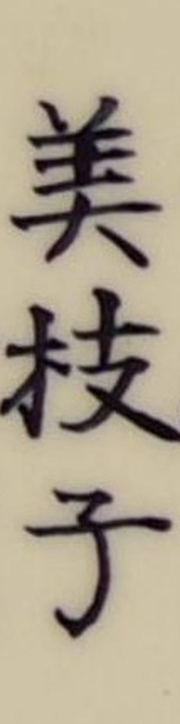美枝子
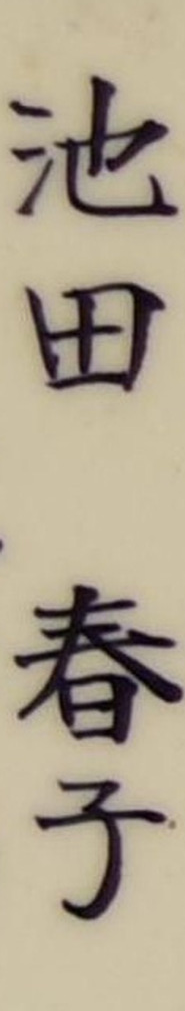池田春子
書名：E~L
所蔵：高野山金剛峯寺
